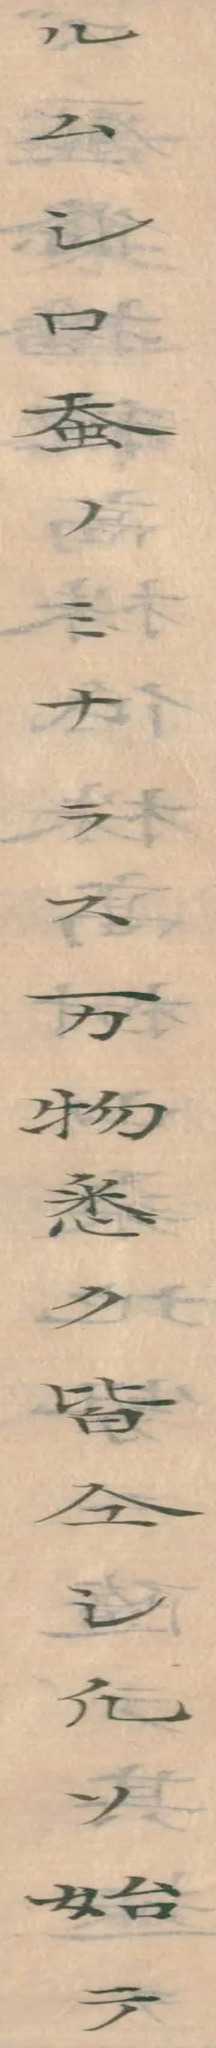ルムシロ蚕ノミナラス万物悉ク皆仝シ凡ソ始テ
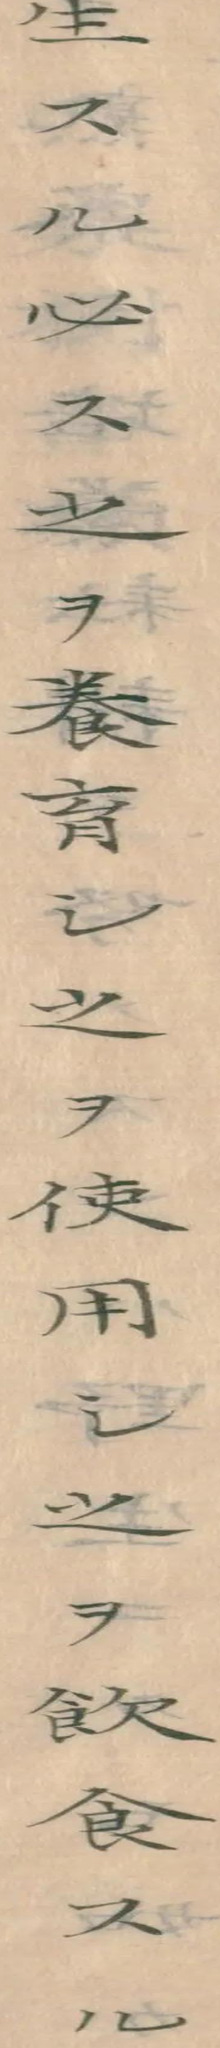生スル必ス之ヲ養育シ之ヲ使用シ之ヲ飲食スル
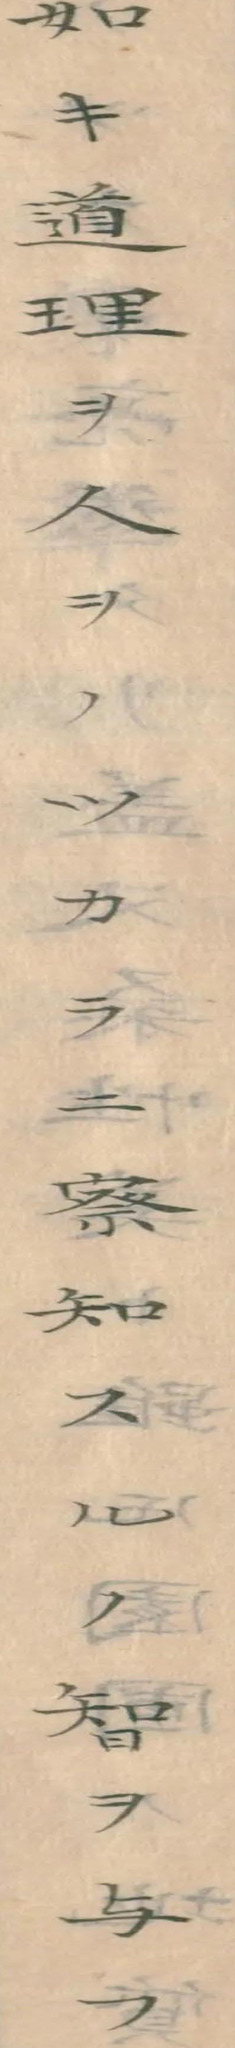如キ道理ヲ人ヲノツカラニ察知スルノ智ヲ与フ
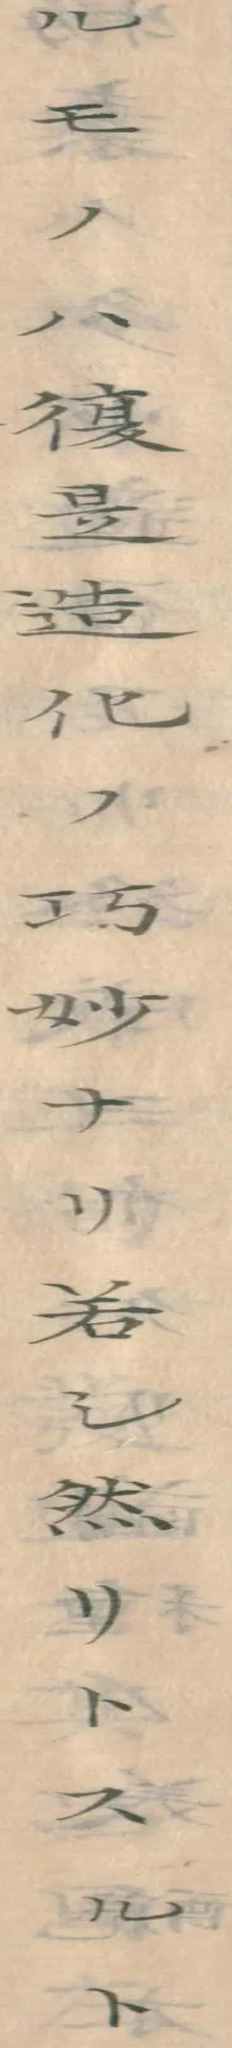ルモノハ復是造化ノ巧妙ナリ若シ然リトスルト
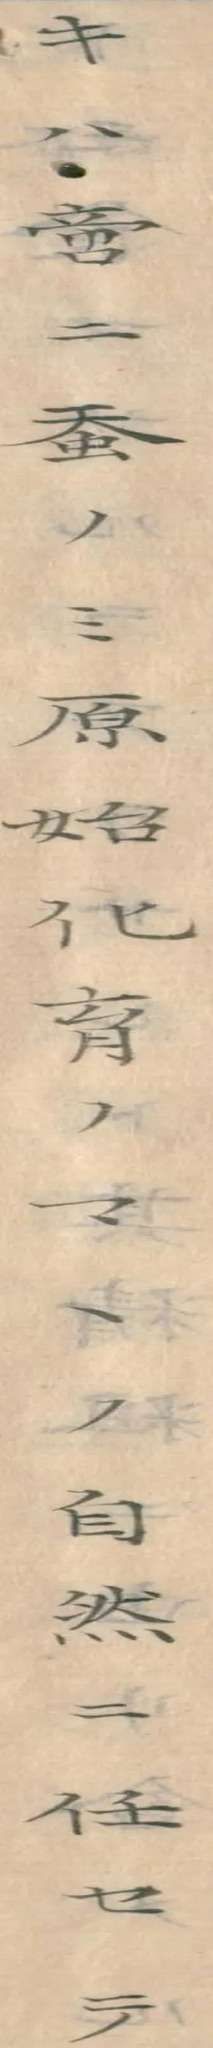キハ啻ニ蚕ノミ原始化育ノマヽノ自然ニ任セテ
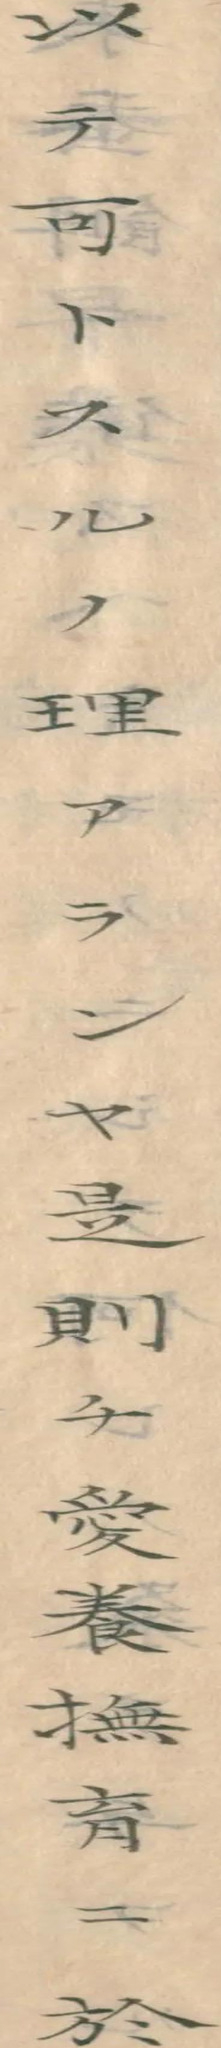以テ可トスルノ理アランヤ是則チ愛養撫育ニ於
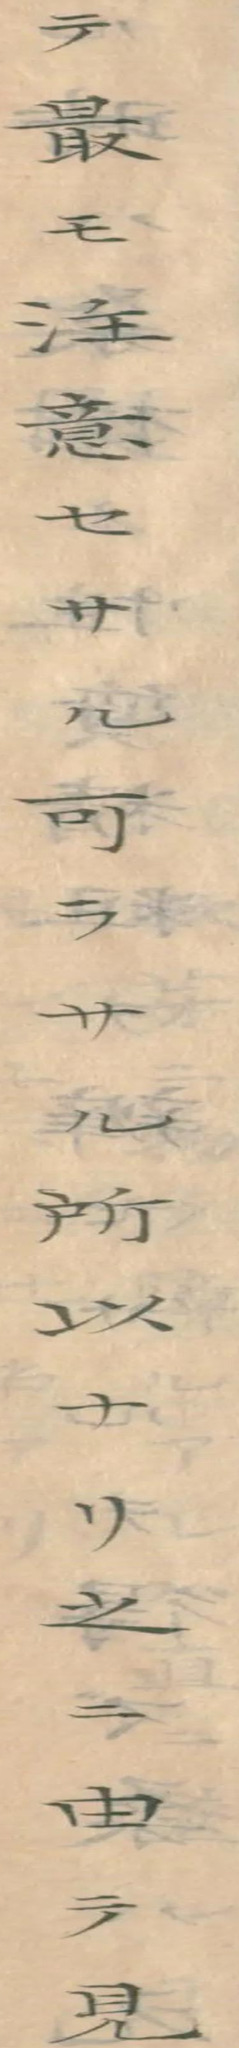テ最モ注意セサル可ラサル所以ナリ之ニ由テ見

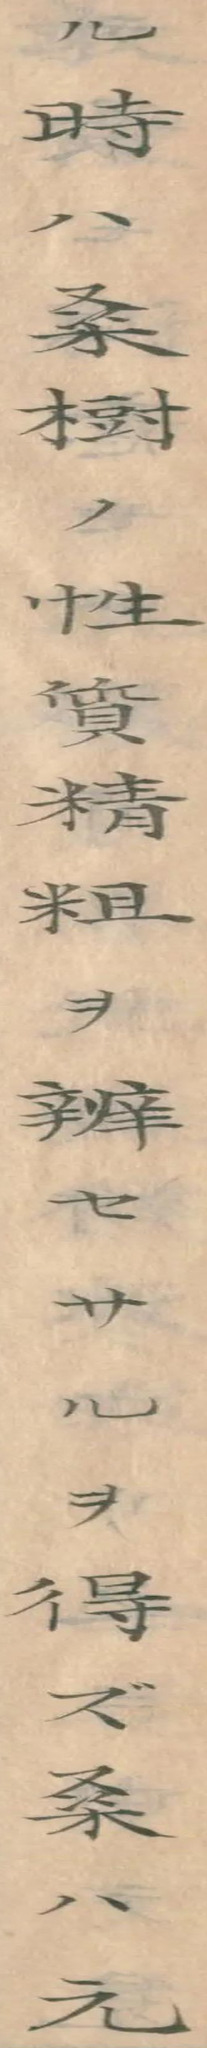ル時ハ桑樹ノ性質精粗ヲ弁セサルヲ得ズ桑ハ元
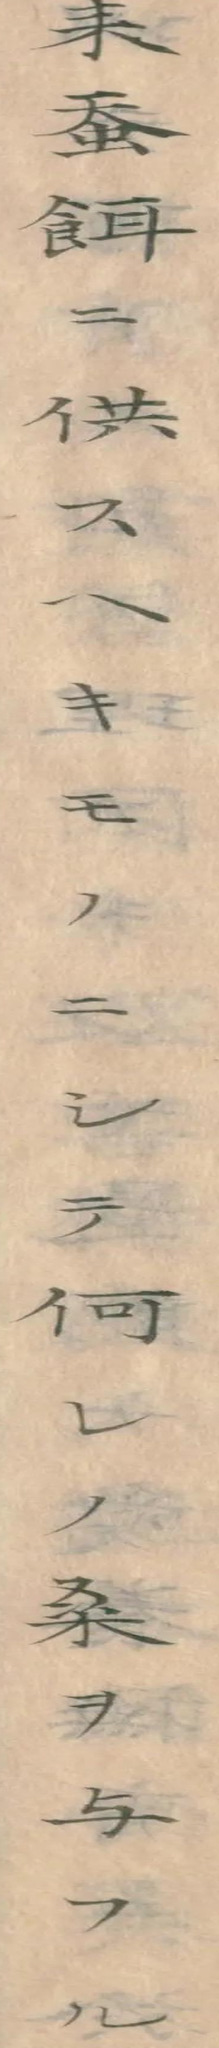来蚕餌ニ供スヘキモノニシテ何レノ桑ヲ与フル
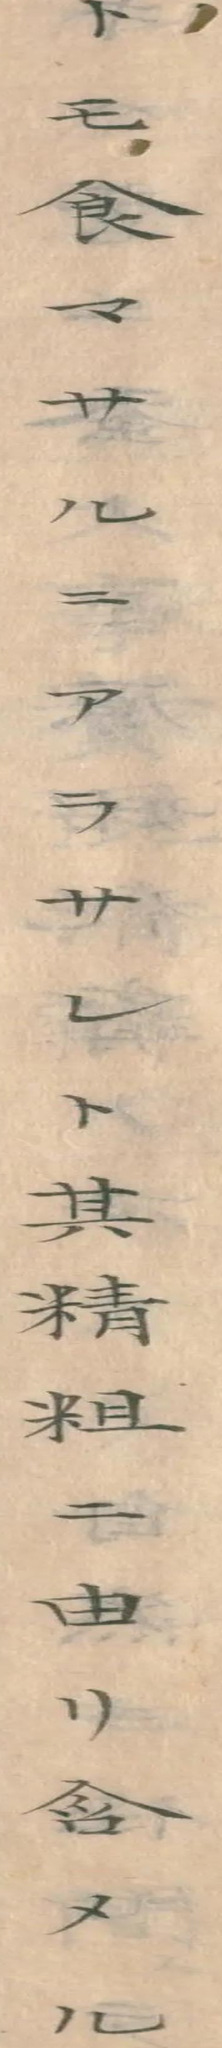トモ食マサルニアラサレト其精粗ニ由リ含メル
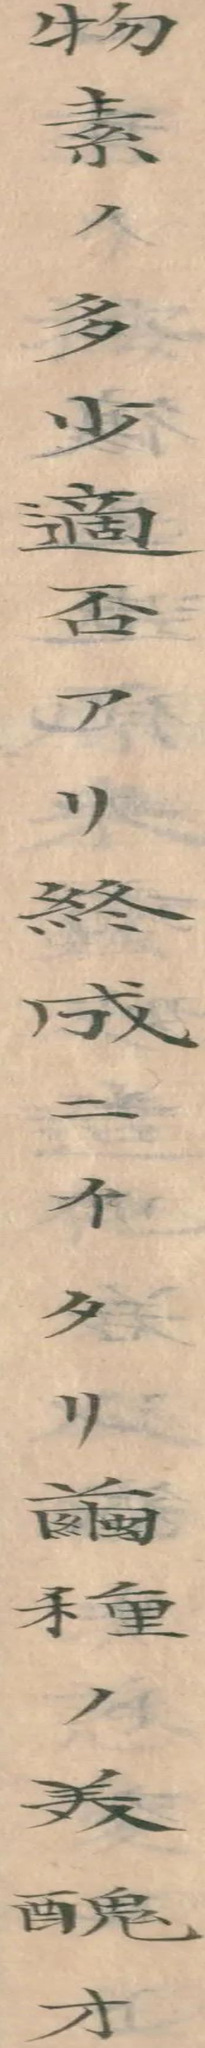物素ノ多少適否アリ終成ニイタリ繭種ノ美醜オ
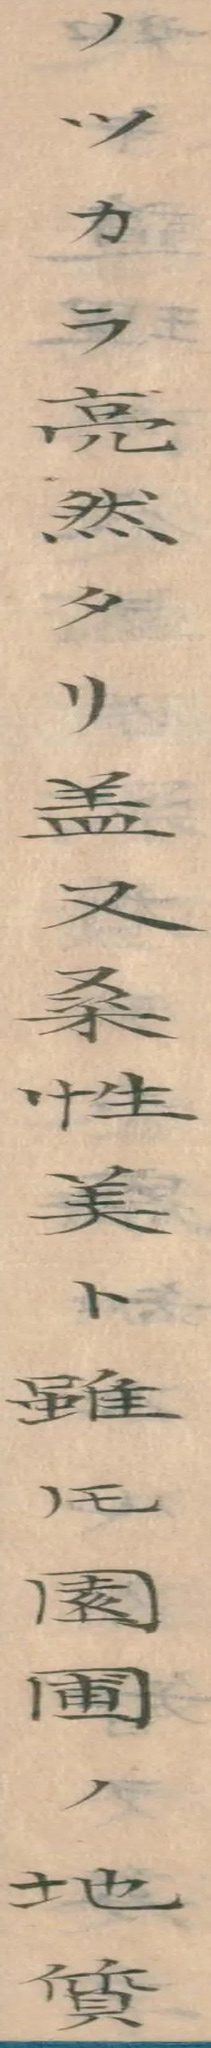ノツカラ亮然タリ蓋又桑性美ト雖トモ園圃ノ地質
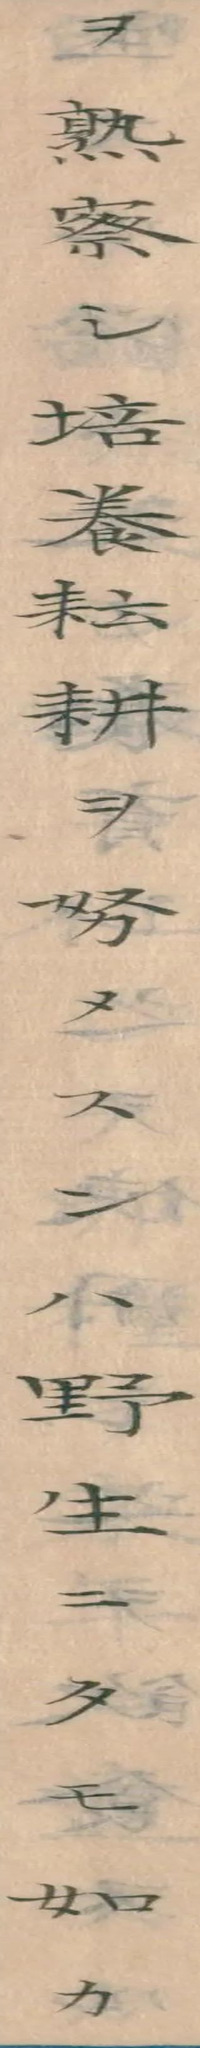ヲ熟察シ培養耘耕ヲ努メスンハ野生ニタモ如カ
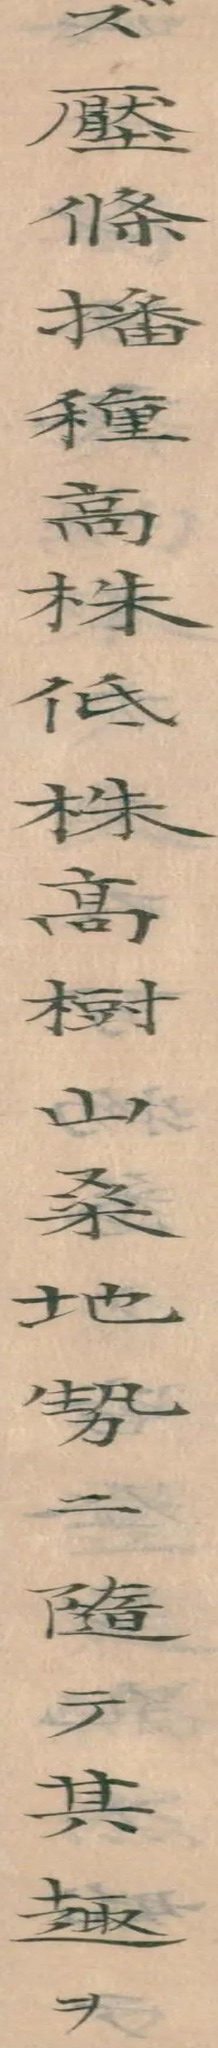ズ圧条播種高株低株高樹山桑地勢ニ随テ其趣ヲ
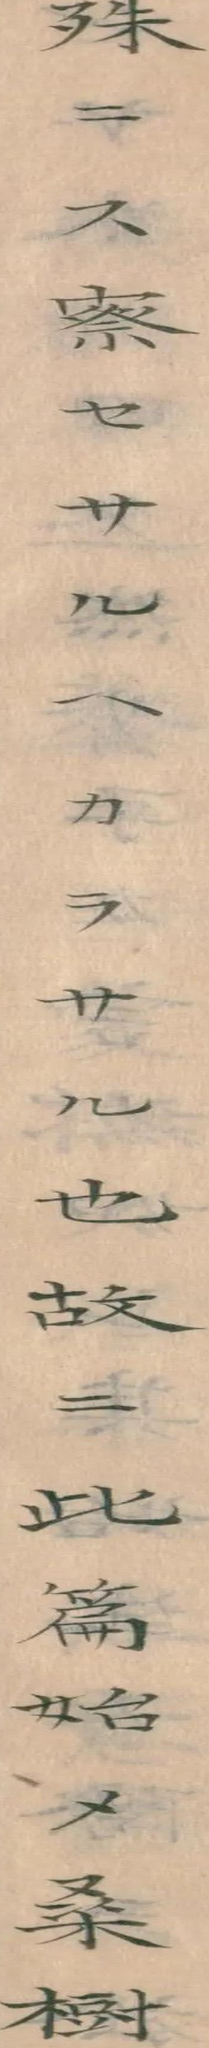殊ニス察セサルヘカラサル也故ニ此篇始メ桑樹
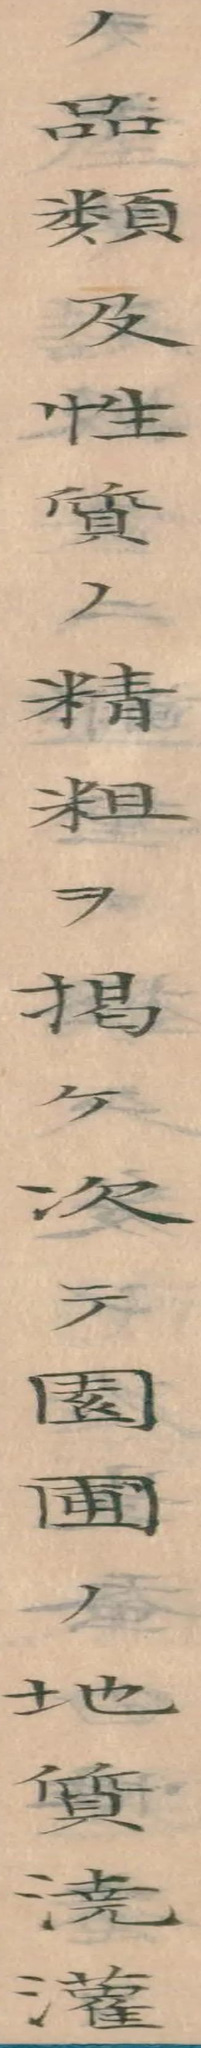ノ品類及性質ノ精粗ヲ掲ケ次テ園圃ノ地質澆灌
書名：蚕桑集成
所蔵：国立国会図書館 National Diet Library, JAPAN
